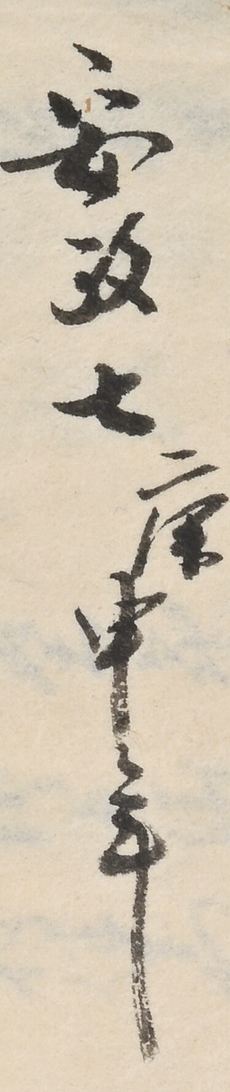安政七庚申年
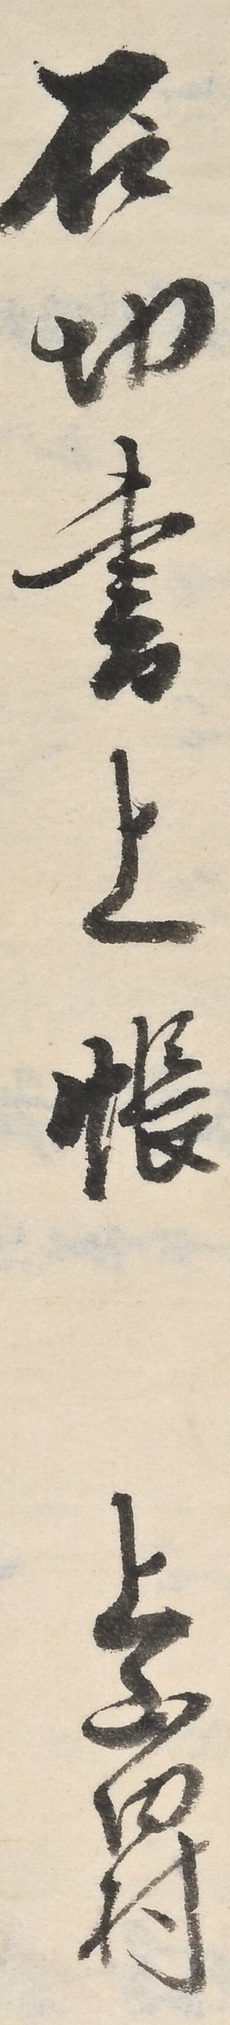石切書上帳上山田村
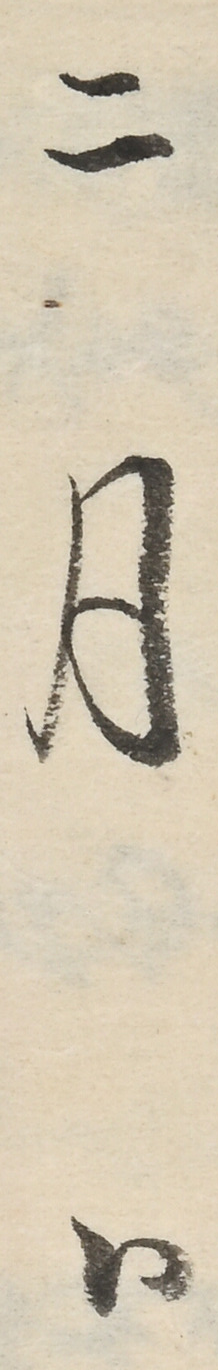二月日

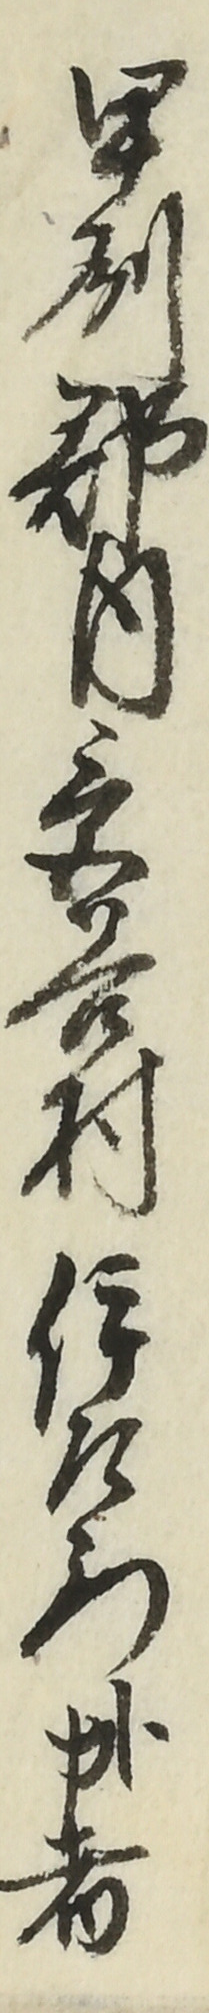甲州郡内宮谷村伊左衛門ト申者
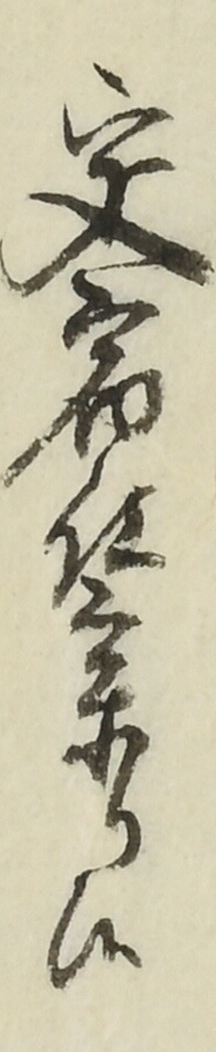定宿仕参り候

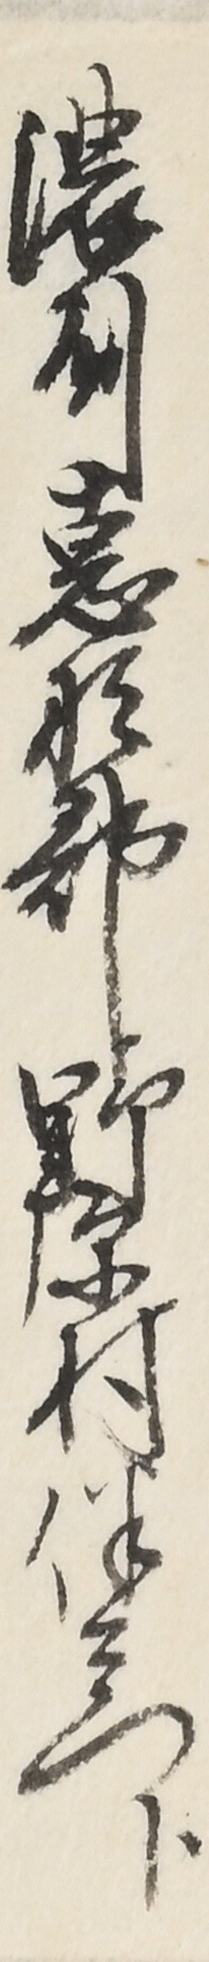濃州恵那郡野原村伴右衛門ト
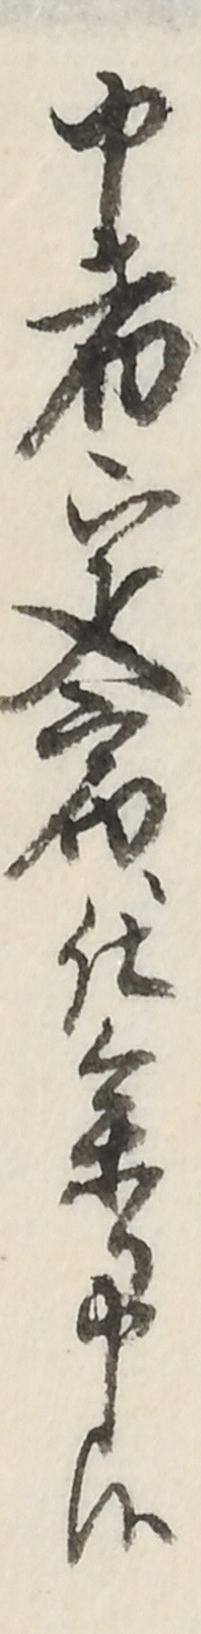申者定宿仕参り申候
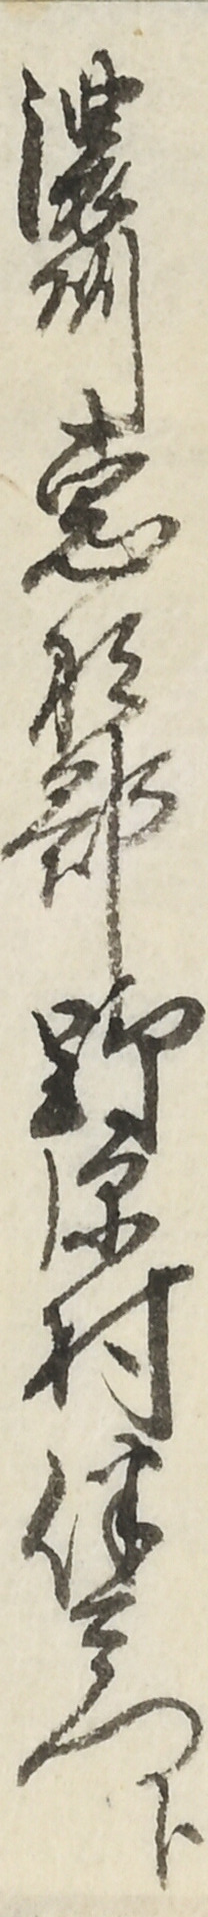濃州恵那郡野原村伴右衛門ト
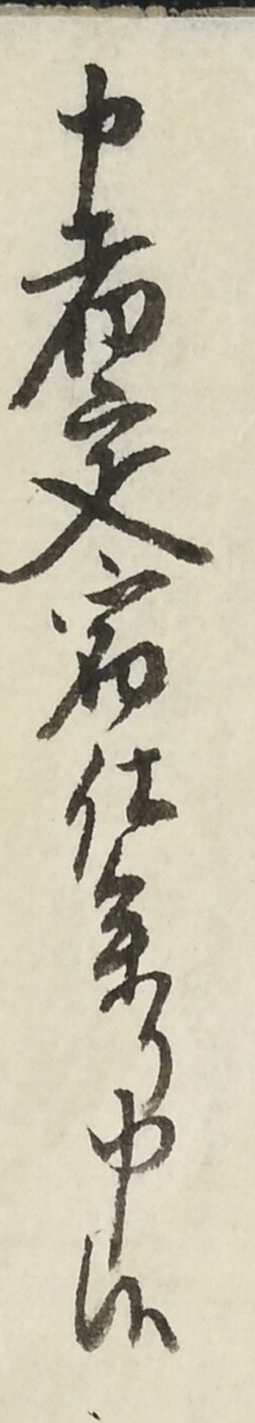申者定宿仕参り申候

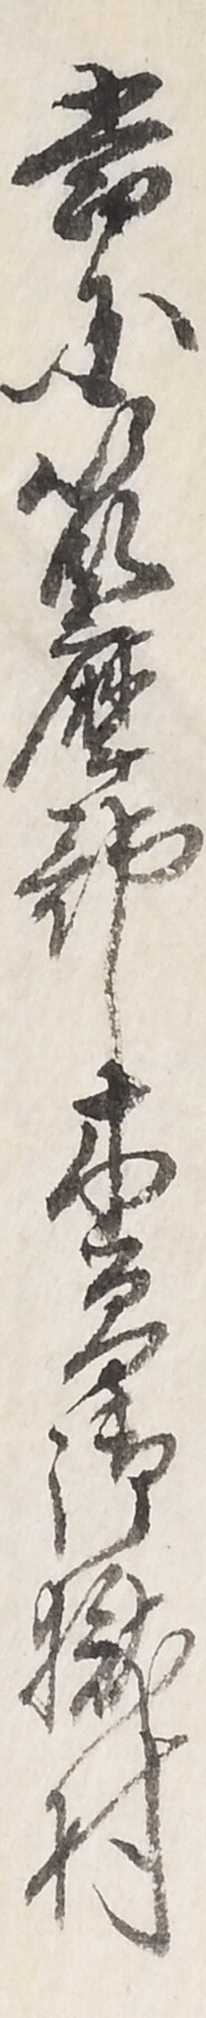当国筑摩郡木曽御嶽村
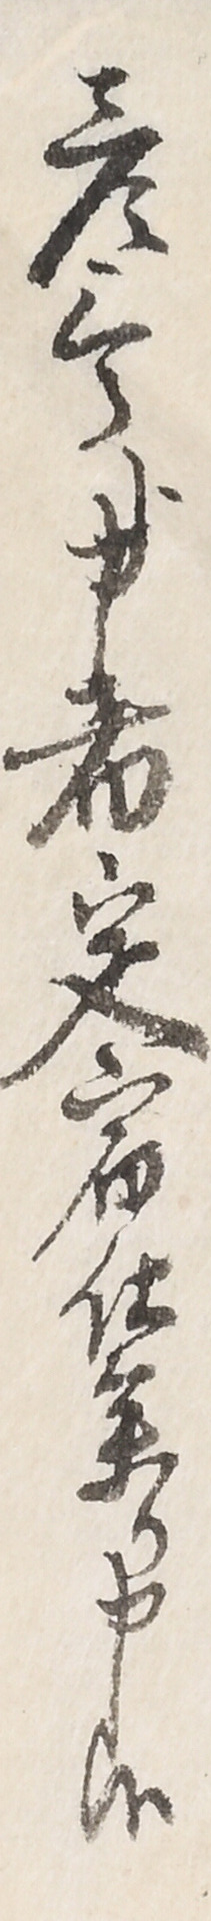彦三郎ト申者定宿仕参り申候
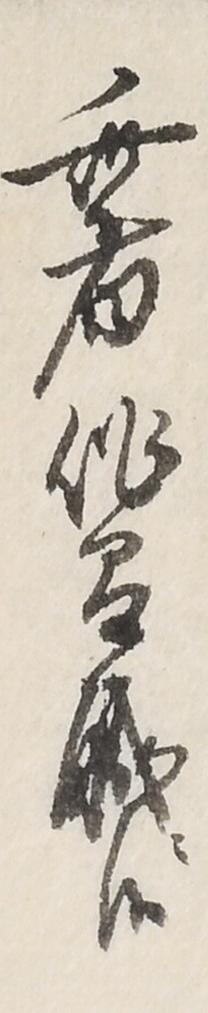此者作間職ニ候
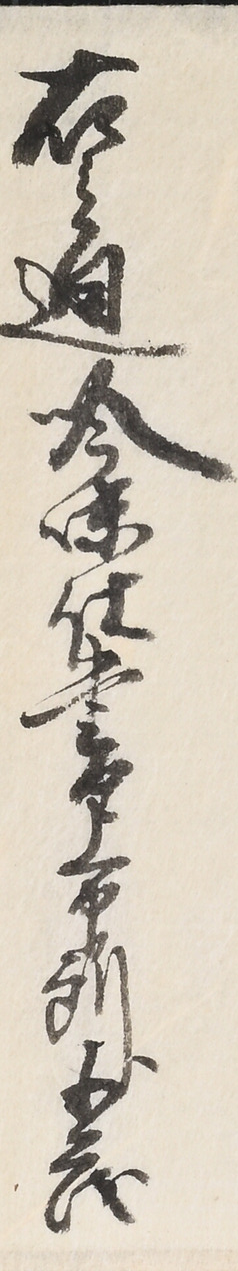右之通吟味仕書上申所少茂
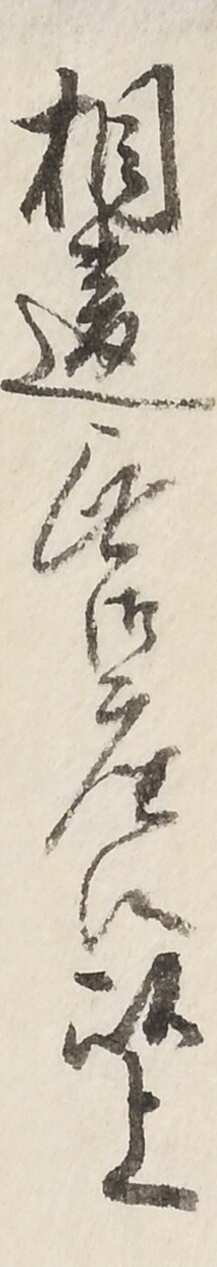相違無御座候以上
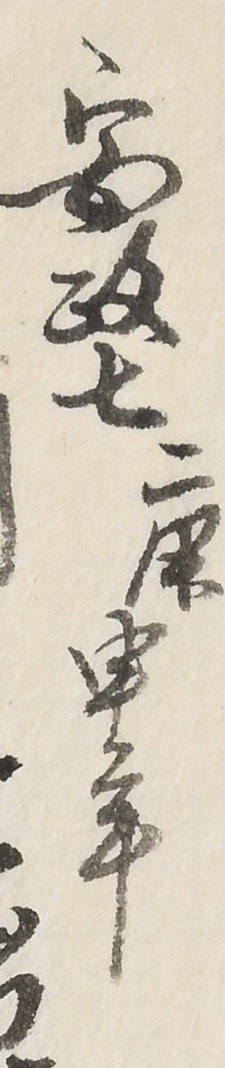安政七庚申年
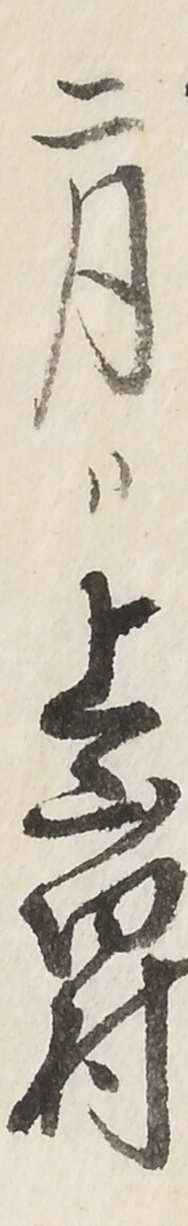二月日上山田村
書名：安政七庚申年二月日石切書上帳
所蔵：伊那市立高遠町図書館・合同会社AMANE
